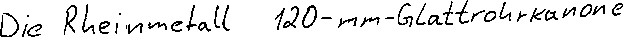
Die Rheinmetall 120-mm-Glattrohrkanone
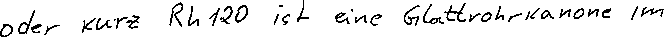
oder kurz Rh120 ist eine Glattrohrkanone im
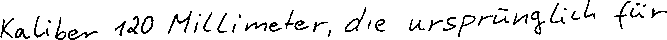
Kaliber 120 Millimeter, die ursprünglich für
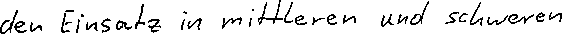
den Einsatz in mittleren und schweren
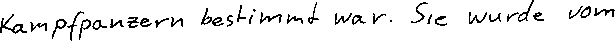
Kampfpanzern bestimmt war. Sie wurde vom
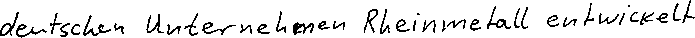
deutschen Unternehmen Rheinmetall entwickelt
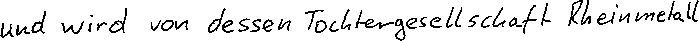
und wird von dessen Tochtergesellschaft Rheinmetall
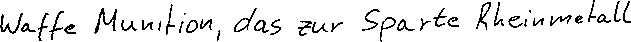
Waffe Munition, das zur Sparte Rheinmetall
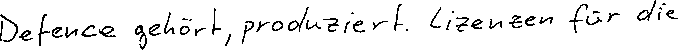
Defence gehört, produziert. Lizenzen für die
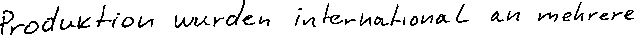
Produktion wurden international an mehrere
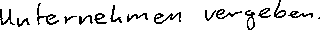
Unternehmen vergeben.
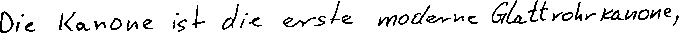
Die Kanone ist die erste moderne Glattrohrkanone,
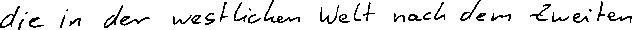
die in der westlichen Welt nach dem Zweiten
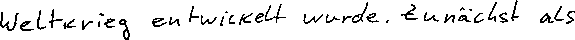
Weltkrieg entwickelt wurde. Zunächst als
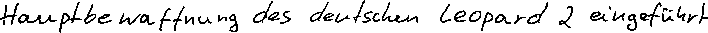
Hauptbewaffnung des deutschen Leopard 2 eingeführt
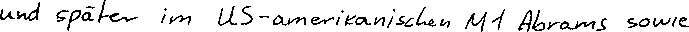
und später im US-amerikanischen M1 Abrams sowie
